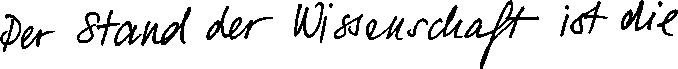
Der Stand der Wissenschaft ist die
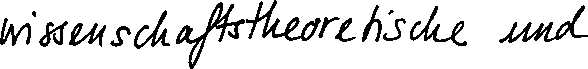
wissenschaftstheoretische und
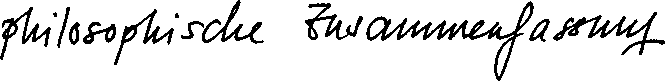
philosophische Zusammenfassung
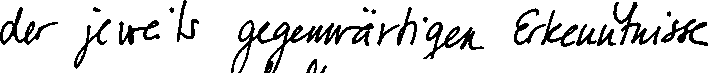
der jeweils gegenwärtigen Erkenntnisse
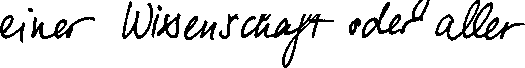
einer Wissenschaft oder aller
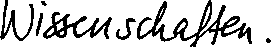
Wissenschaften.
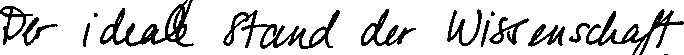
Der ideale Stand der Wissenschaft
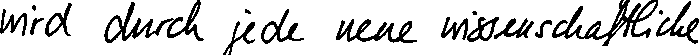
wird durch jede neue wissenschaftliche
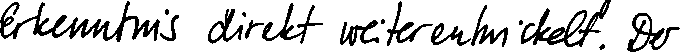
Erkenntnis direkt weiterentwickelt. Der
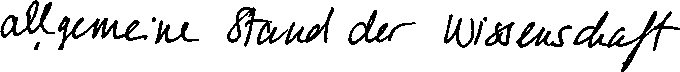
allgemeine Stand der Wissenschaft
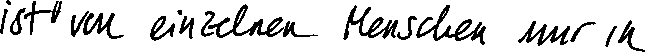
ist von einzelnen Menschen nur in
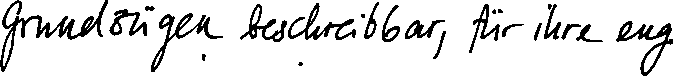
Grundzügen beschreibbar, für ihre eng
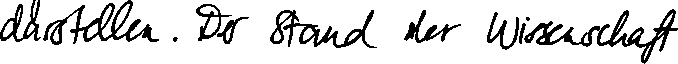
darstellen. Der Stand der Wissenschaft
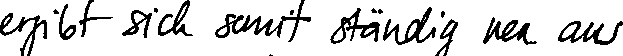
ergibt sich somit ständig neu aus
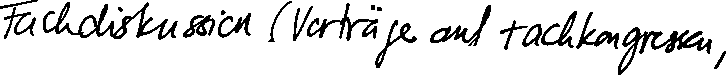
Fachdiskussion (Vorträge auf Fachkongressen,
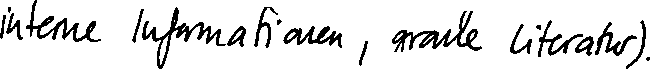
interne Informationen, graue Literatur).
